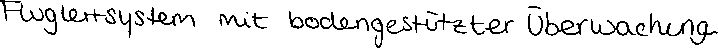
Flugleitsystem mit bodengestützter Überwachung
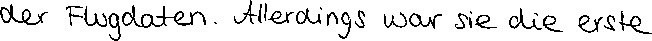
der Flugdaten. Allerdings war sie die erste
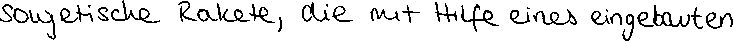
sowjetische Rakete, die mit Hilfe eines eingebauten
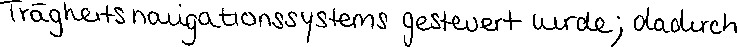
Trägheitsnavigationssystems gesteuert wurde; dadurch
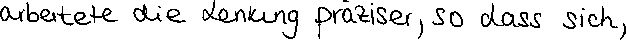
arbeitete die Lenkung präziser, so dass sich,
